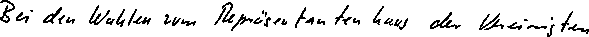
Bei den Wahlen zum Repräsentantenhaus der Vereinigten
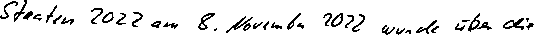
Staaten 2022 am 8. November 2022 wurde über die
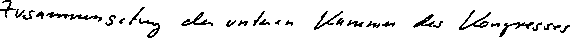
Zusammensetzung der unteren Kammer des Kongresses
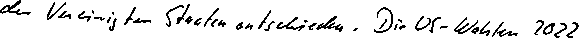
der Vereinigten Staaten entschieden.Die US-Wahlen 2022
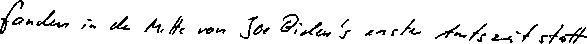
fanden in der Mitte von Joe Bidens erster Amtszeit statt
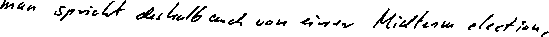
man spricht deshalb auch von einer Midterm election,
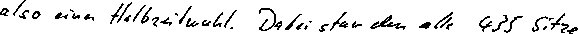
also einer Halbzeitwahl. Dabei standen alle 435 Sitze
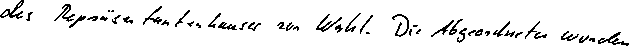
des Repräsentantenhauses zur Wahl. Die Abgeordneten wurden
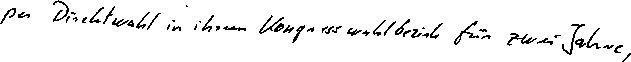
per Direktwahl in ihrem Kongresswahlbezirk für zwei Jahre,
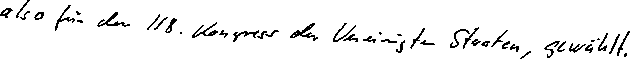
also für den 118. Kongress der Vereinigten Staaten, gewählt.
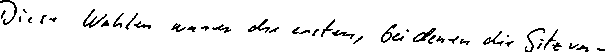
Diese Wahlen waren die ersten, bei denen die Sitzve-
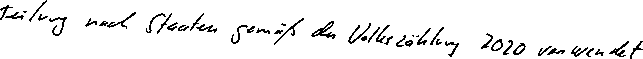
teilung nach Staaten gemäß der Volkszählung 2020 verwendet
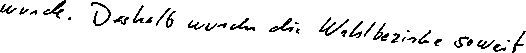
wurde. Deshalb wurden die Wahlbezirke soweit
